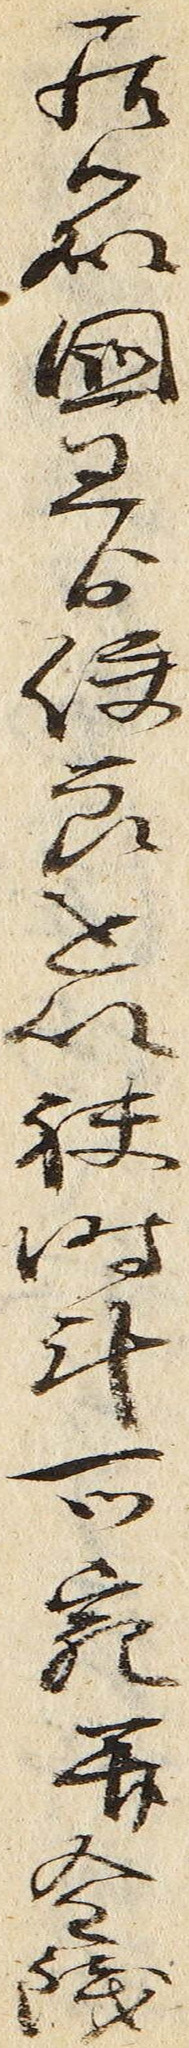居候処国王ゟ使節を以袂時計一ツ宛并金銭
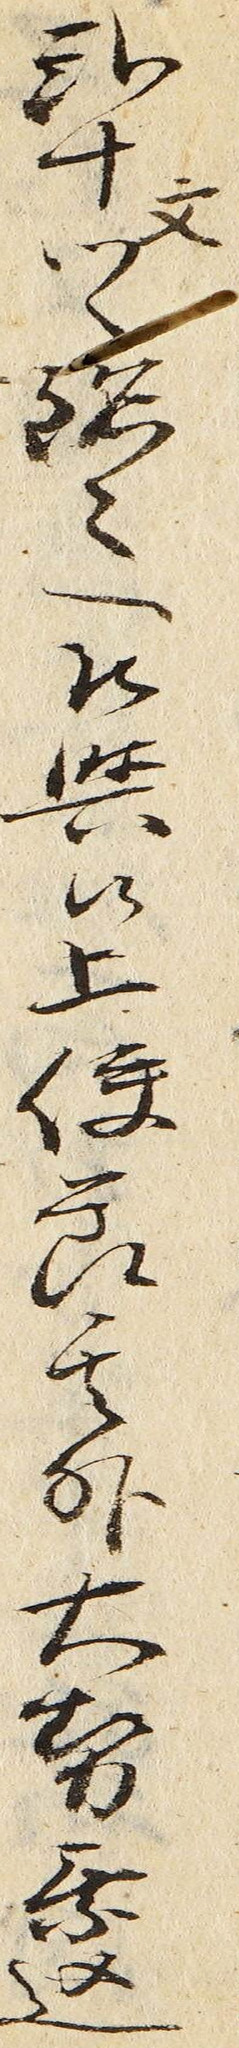弐十文ツヽ銘々へ被与候上使節其外大勢乗込
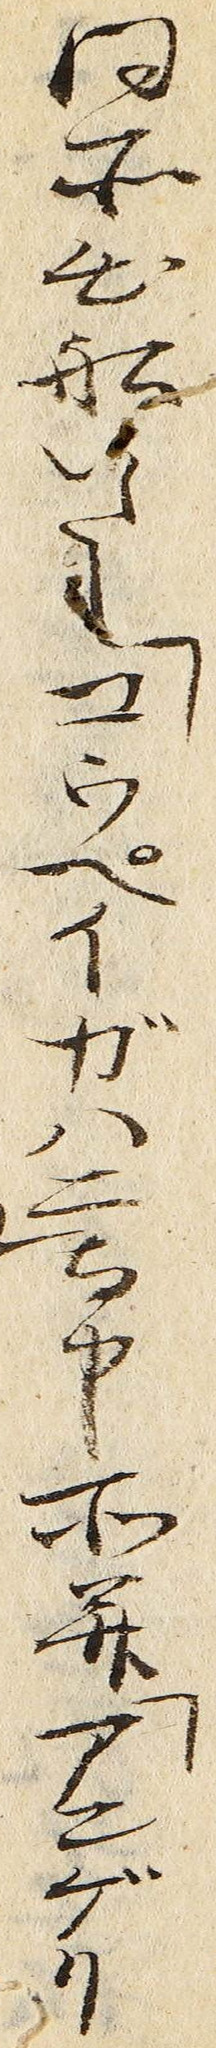同所出船いたし「コウペイガハニ」と申所并「アンゲリ
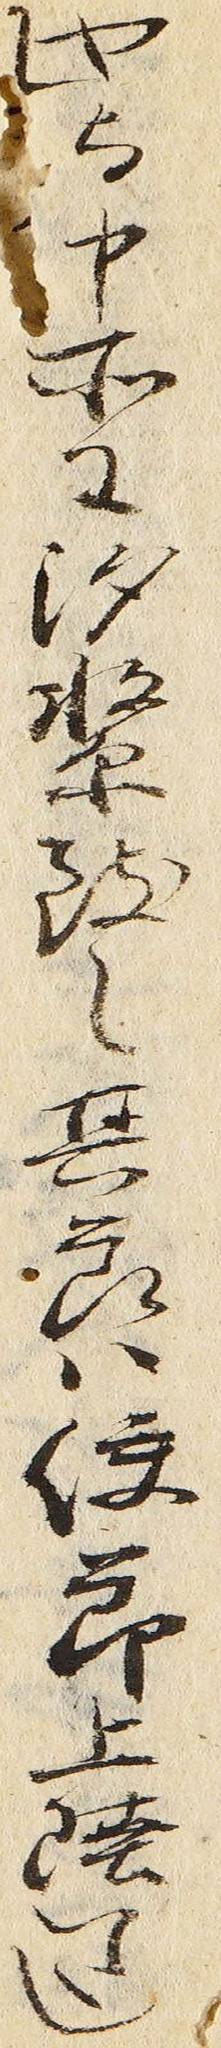ヤ」と申所に汐繋致し其節は使節上陸いたし
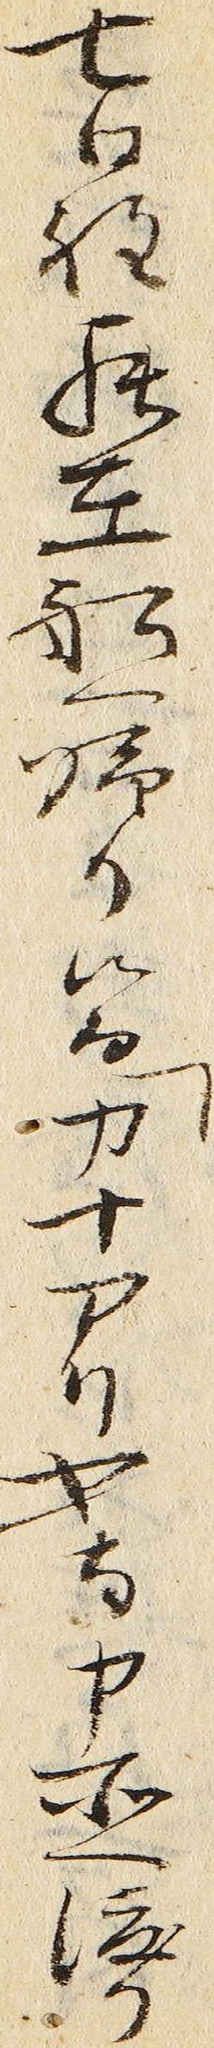七日程罷在船へ帰り候て「カナアリヤ」と申所へ渡り
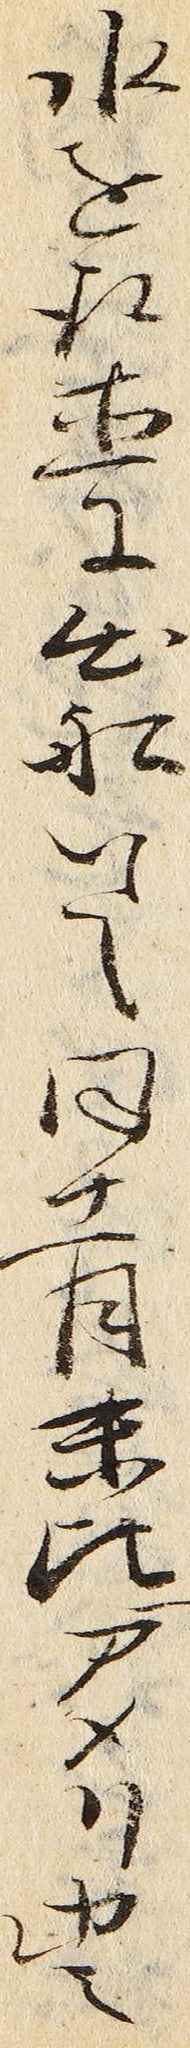水を取直に出船いたし同十一月末比「アメリカ」之
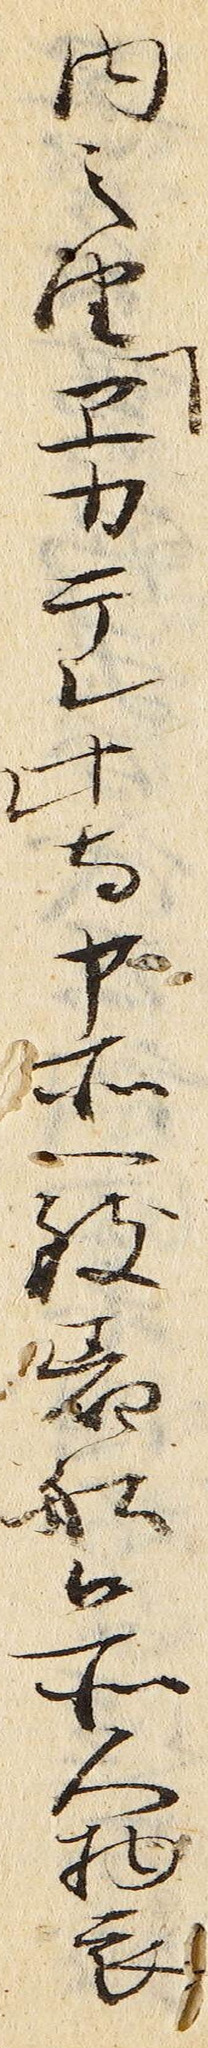内之由「エカテレナ」と申所へ致着船候所人物衣
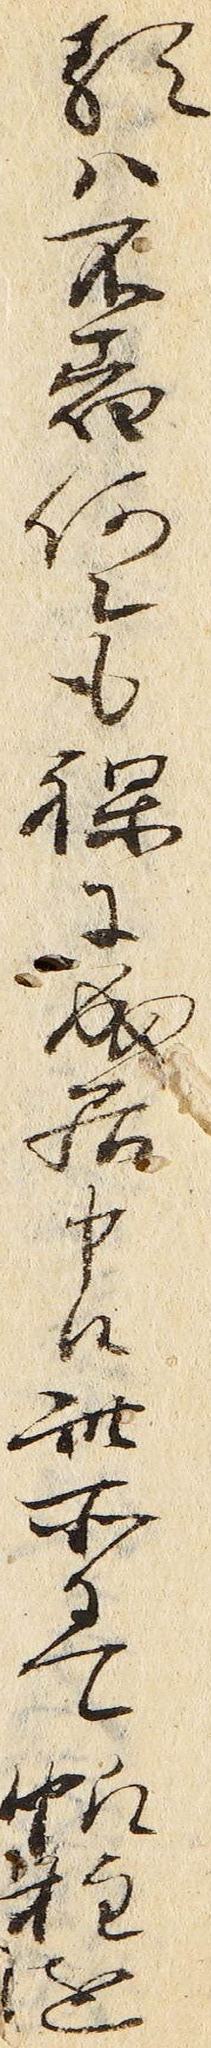類は不着何レも裸に成居申候此所にて帆柱を
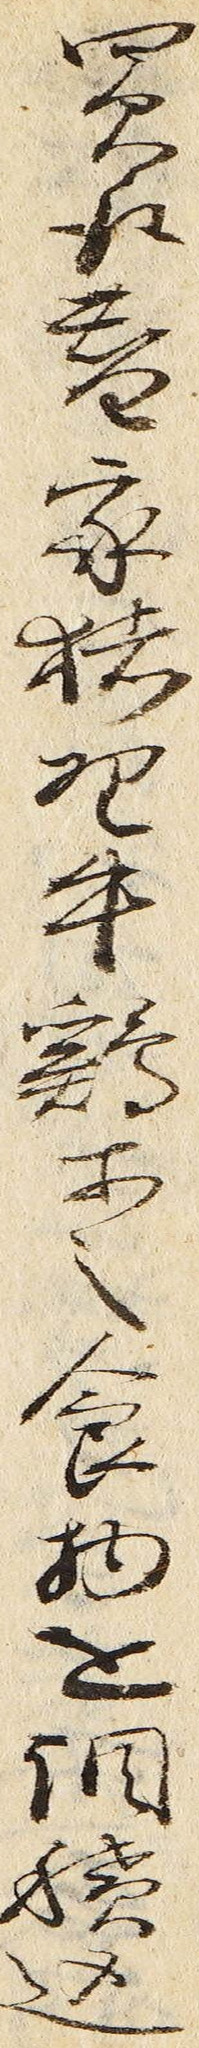買取替家猪野牛鶏等之食物を調積込
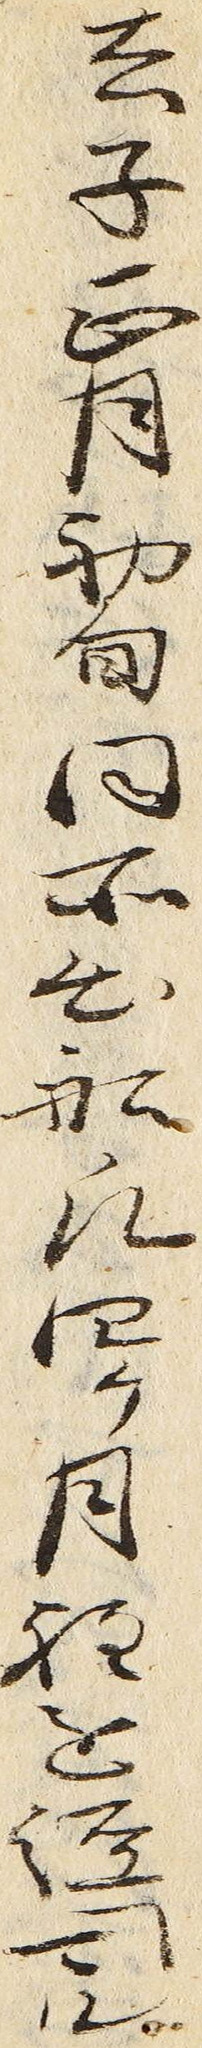去子正月初旬同所出船凡四ヶ月程を経「マル
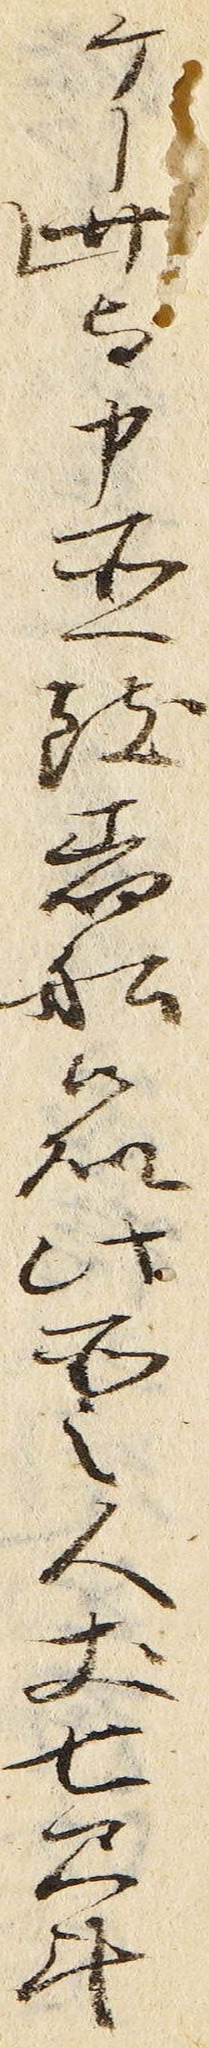ケーサ」と申所へ致着船候処此所之人丈七尺斗
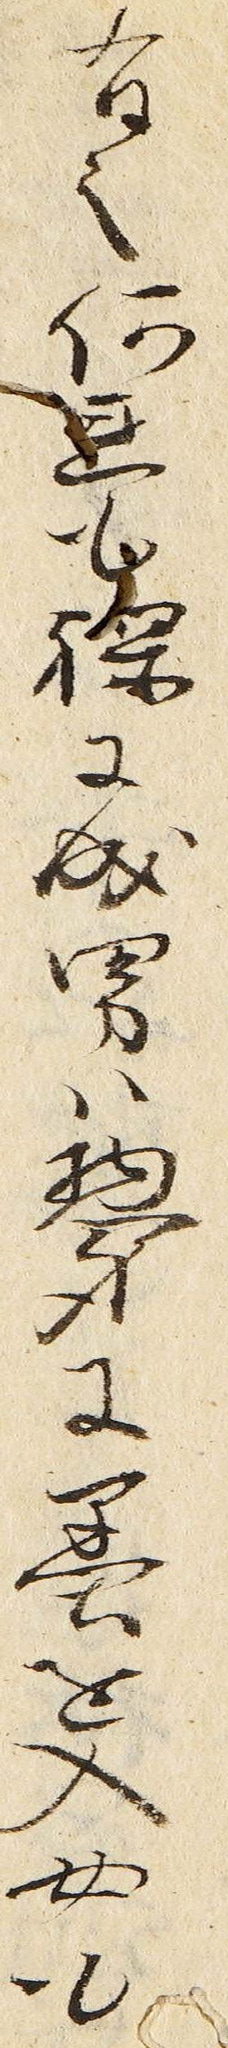有之何れも裸に成男は惣身に墨を入女も
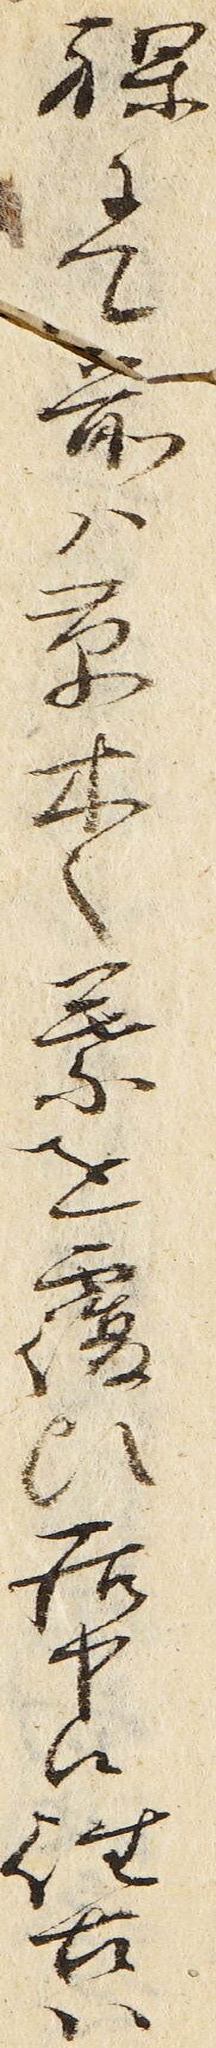裸にて前は草木之葉を覆ひ居申候往古は
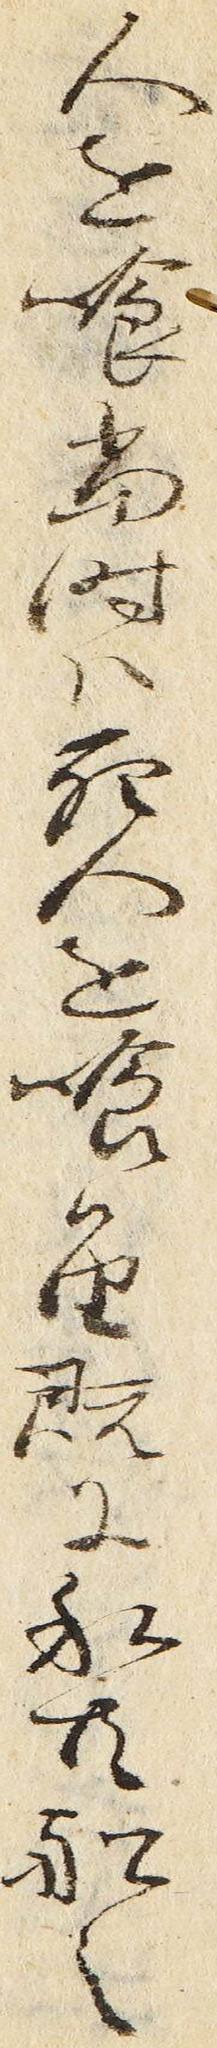人を喰当時は死人を喰候由既に私共船之
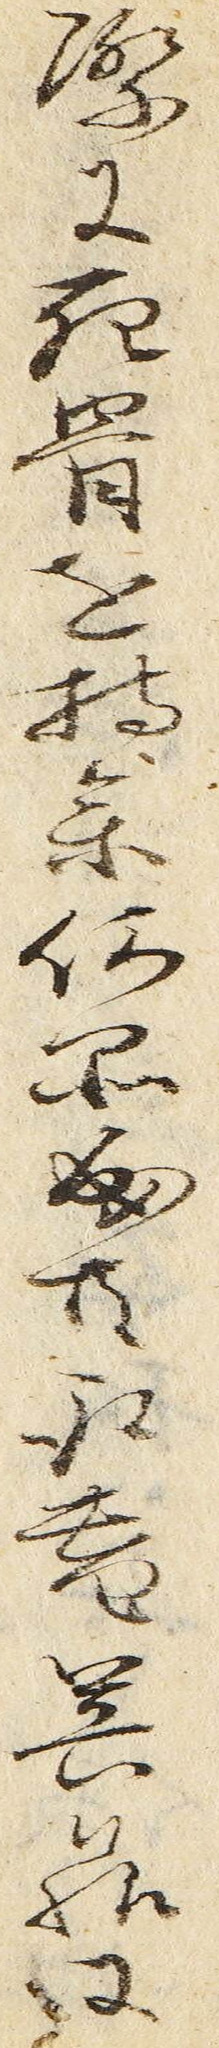際に死骨を持参何品成共取替呉候様に
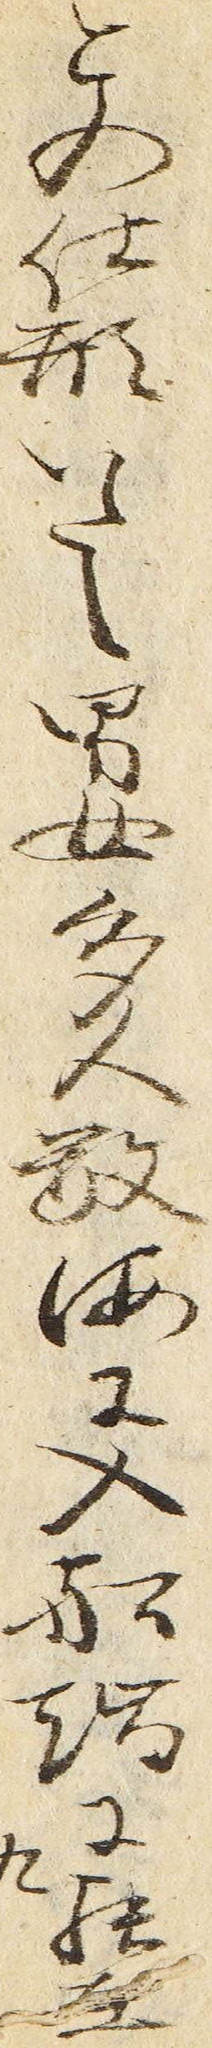との仕形いたし男女多人数海に入船端に罷在
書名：漂民後記
